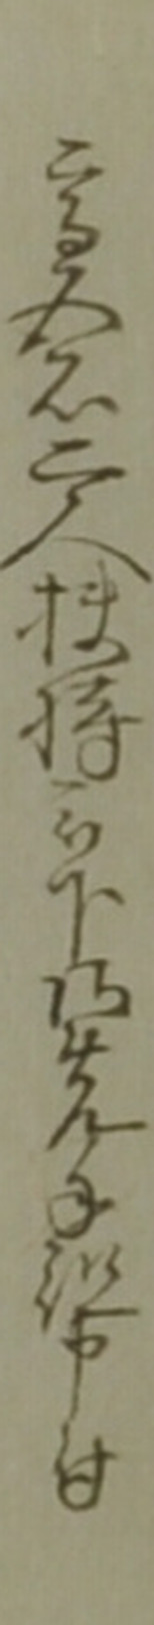高五石二人扶持被下御先手組申付
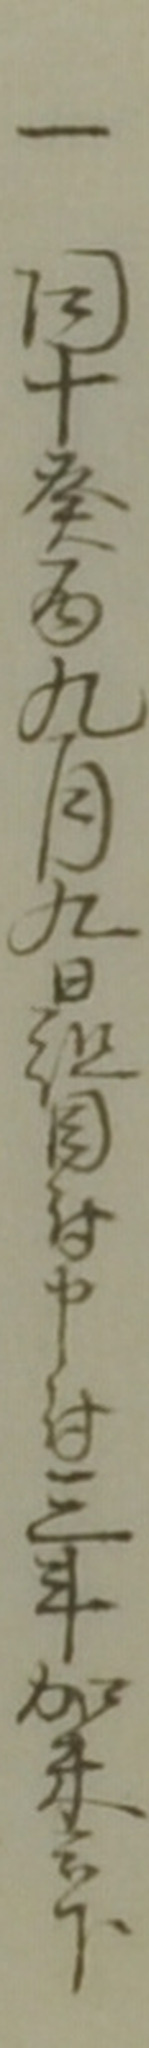一同十癸酉九月組目付申付三斗加米被下
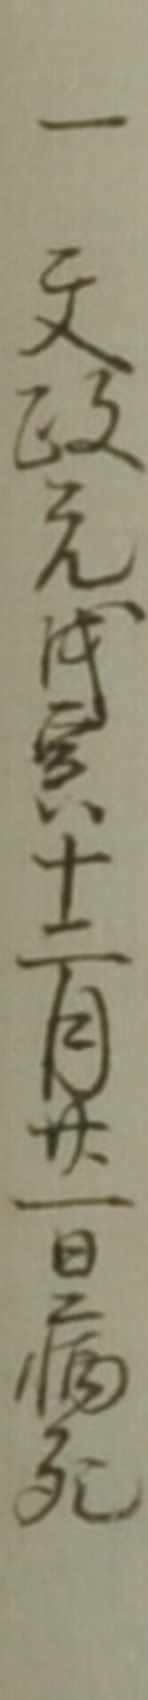一文政元戌寅十二月廿一日病死
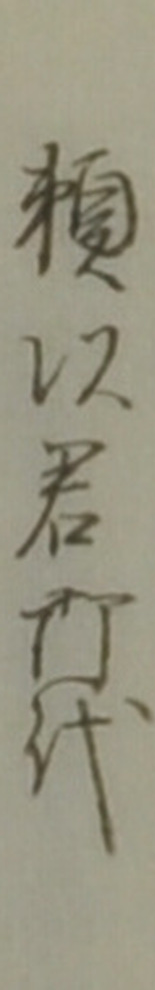頼以君御代
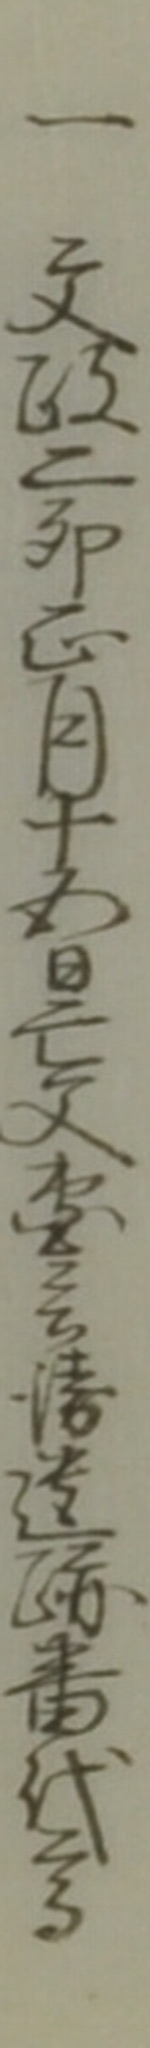一文政二卯正月十五日亡父團兵衛遺跡番代高
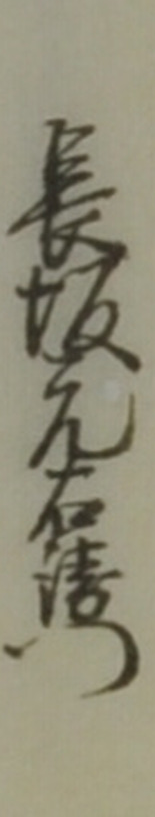長坂元右衛門
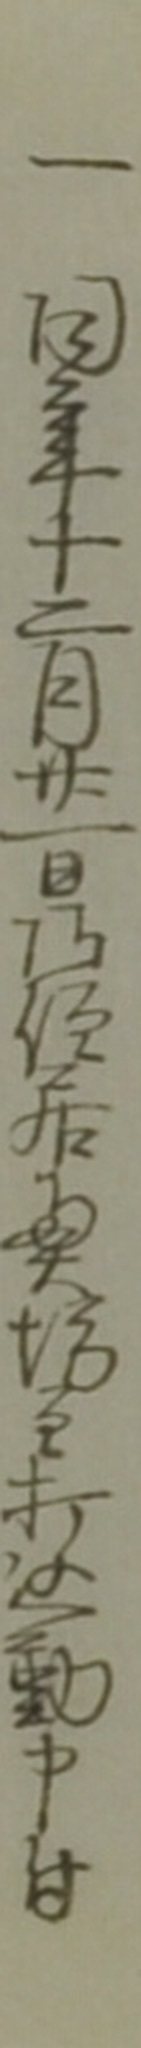一同年十二月廿一日御住居奥坊主打込勤申付
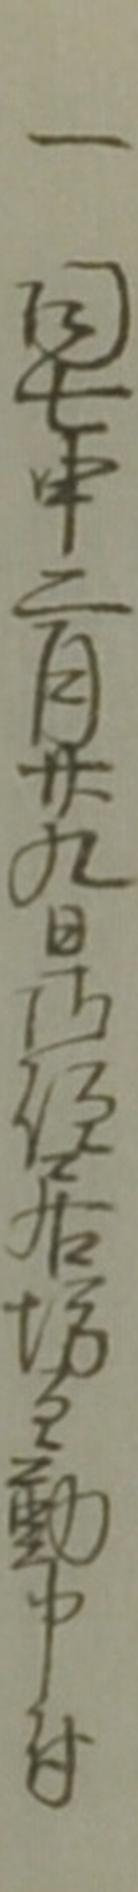一同七申二月廿九日御住居坊主勤申付
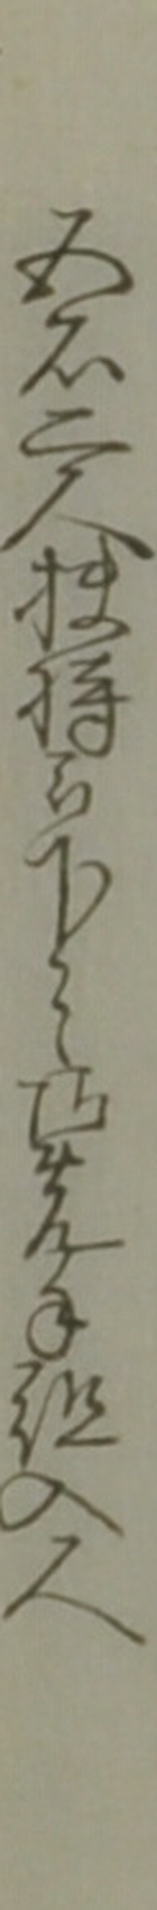五石二人扶持被下之御先手組入人
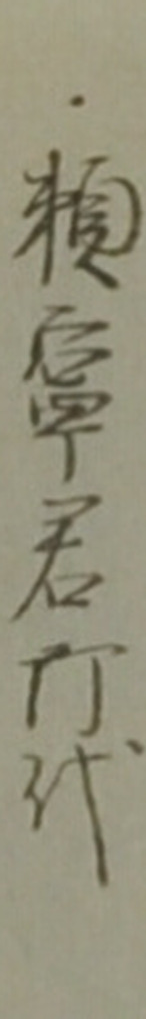頼寧君御代
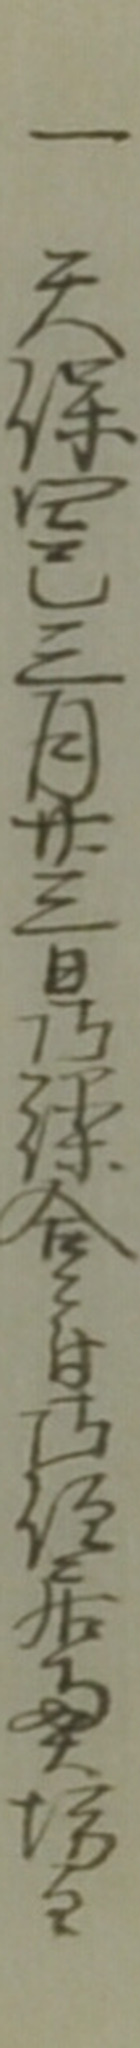一天保四巳三月廿三日御繰合ニ付御表奥勤申付
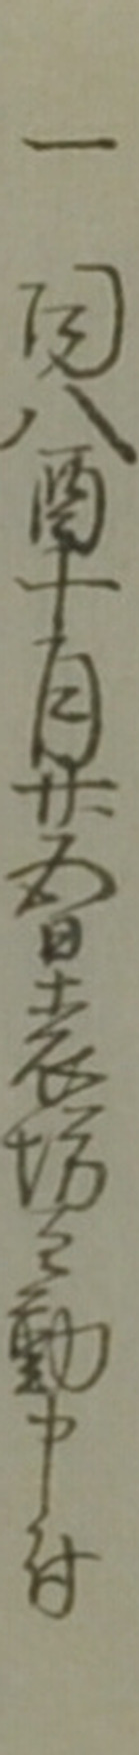一同八酉十月廿五日表坊主勤申付
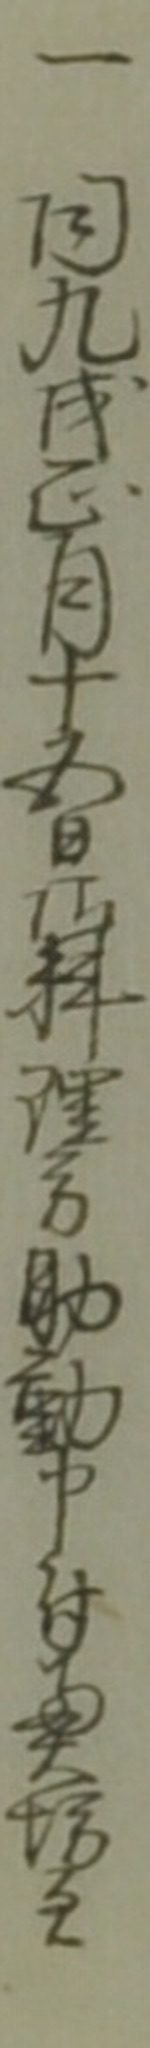一同九戌正月十五日御料理方助勤申付奥坊主
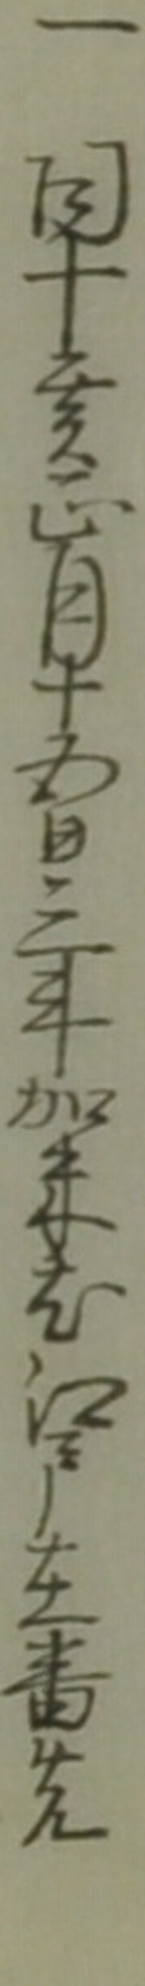一同十亥正月十五日三斗加米尤江戸在番先
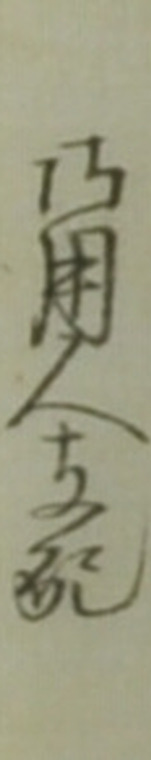御用人支配
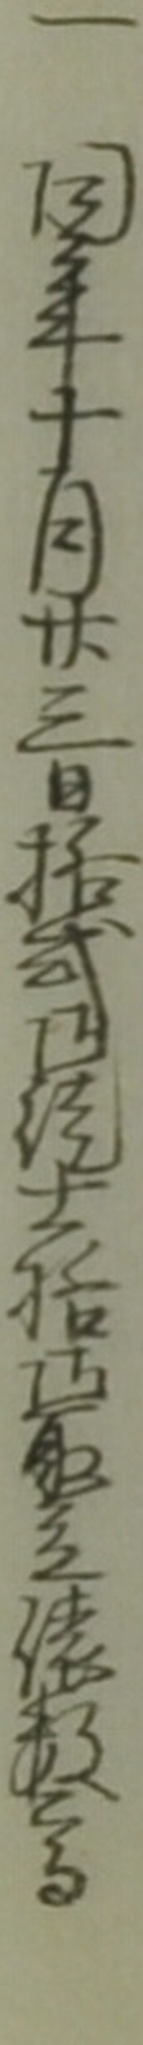一同年十月廿三日格式御徒士御取立俵高
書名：無足諸士勤仕録（八）
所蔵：伊那市立高遠町図書館・合同会社AMANE
